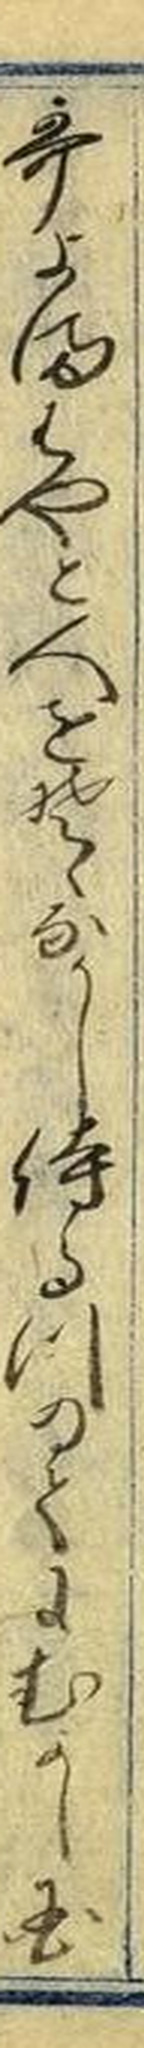哥よまはやと人をそゝなかし侍る川ゐてにむかし国
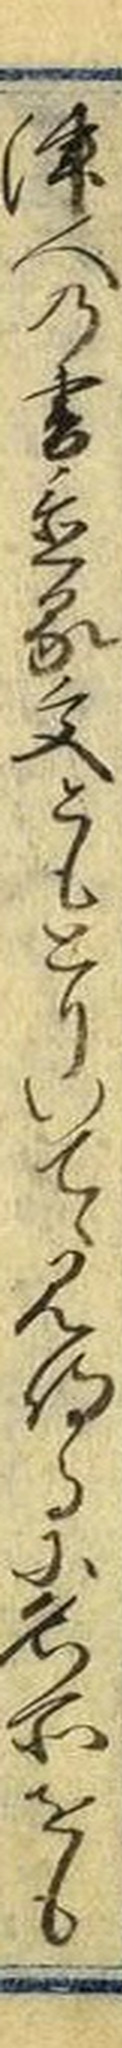津人の書置る文ともとりいてゝ見侍るに名所をも
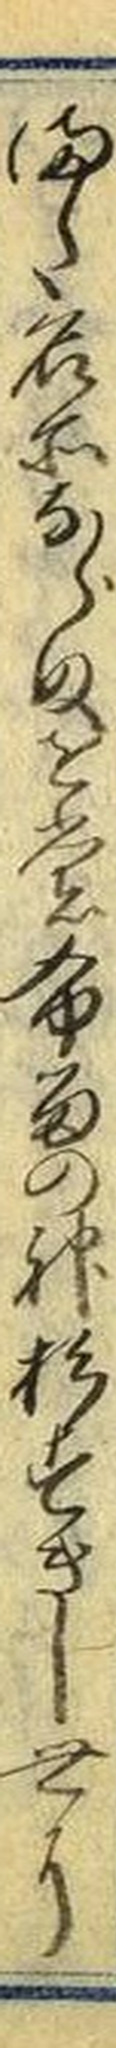また名所ならぬをもふるの神杉すきし世に
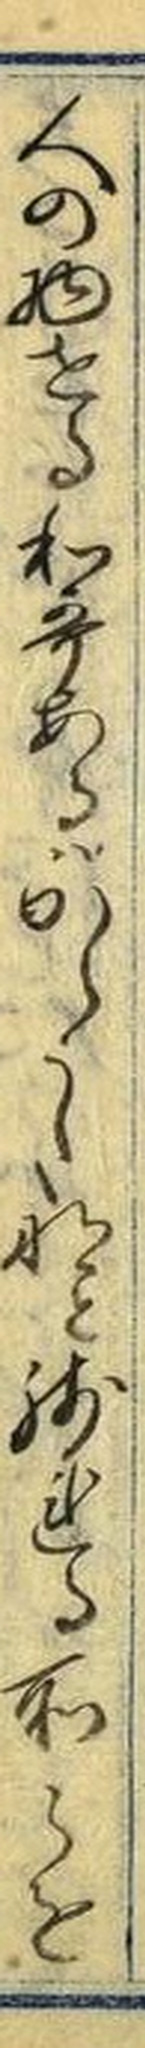人の物せる和哥あるはからうたなと残れる所々を

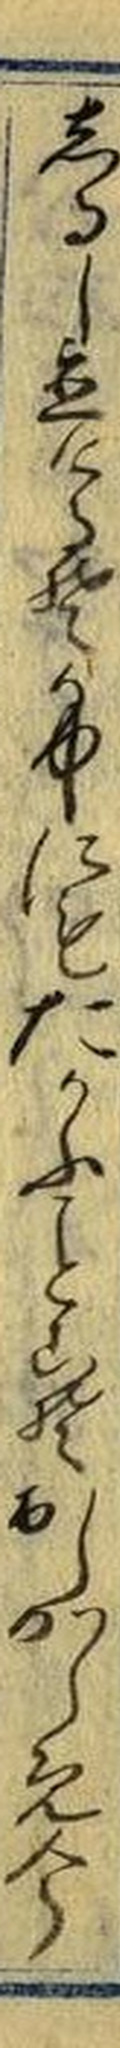しるし置けるそか中にもたかふことそおしからめ今
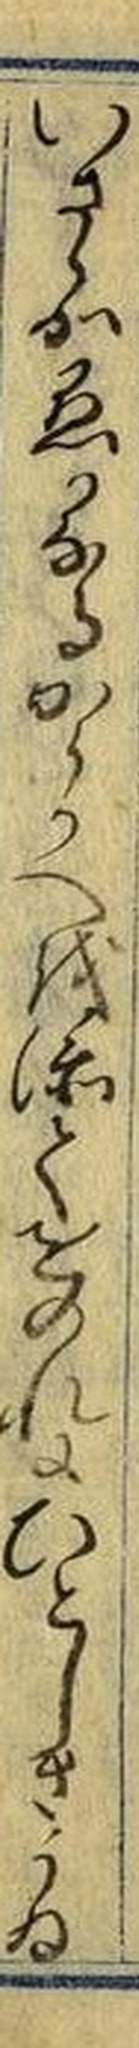いささか愚かなるからかへを添てをのれにひとしきうゐ
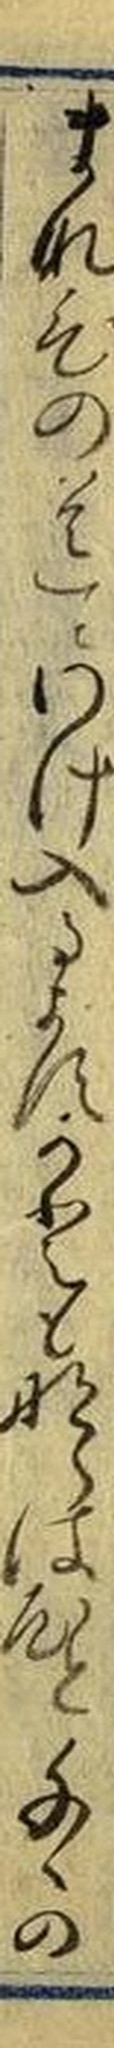まなひの道にわけ入るよすかともならはやと千ゝの
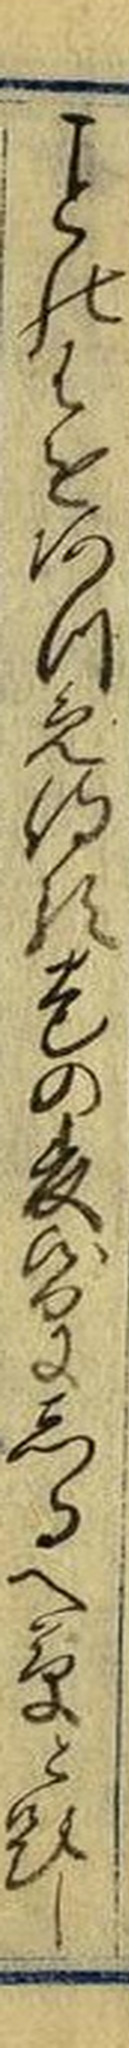ことのはをあつめ侍る巻の表帋にしるへ草と題し
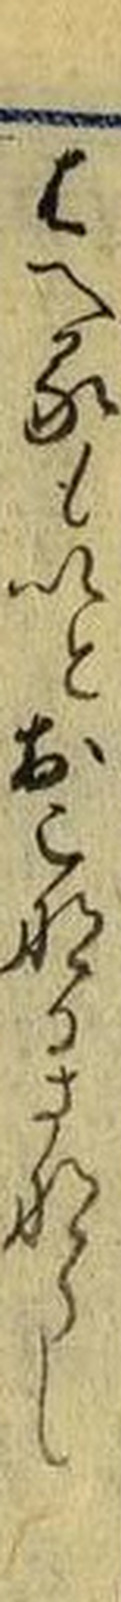はへるもいとおこなるさならし
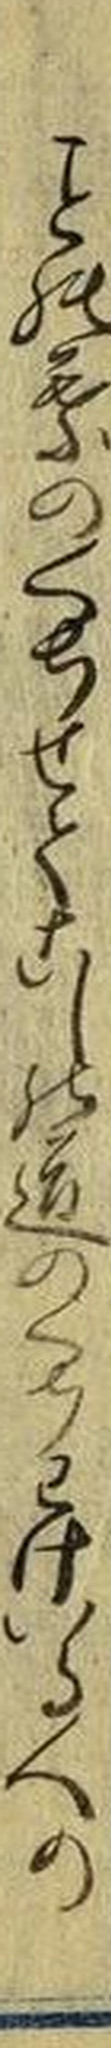ことのはのくちせてこしの道くちわけいる人の
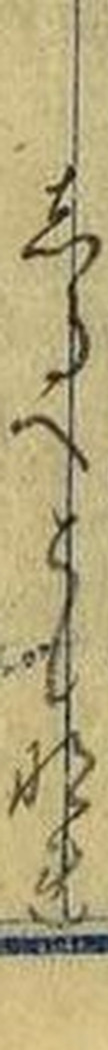しるへともなれ
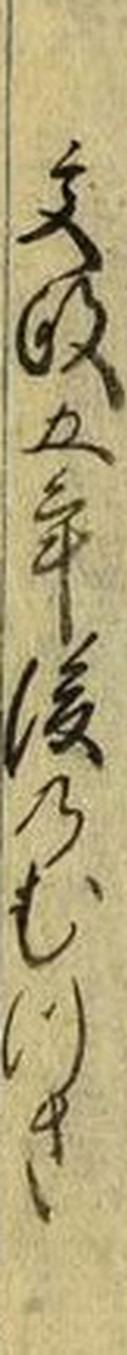文政五年後のむつき
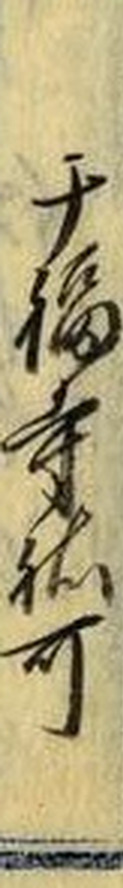千福寺祐可
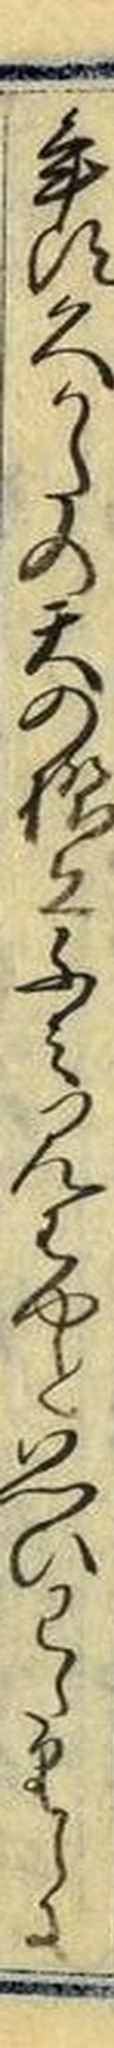年頃久かたの天の橋立ふみ見わやと思ひわたりしに
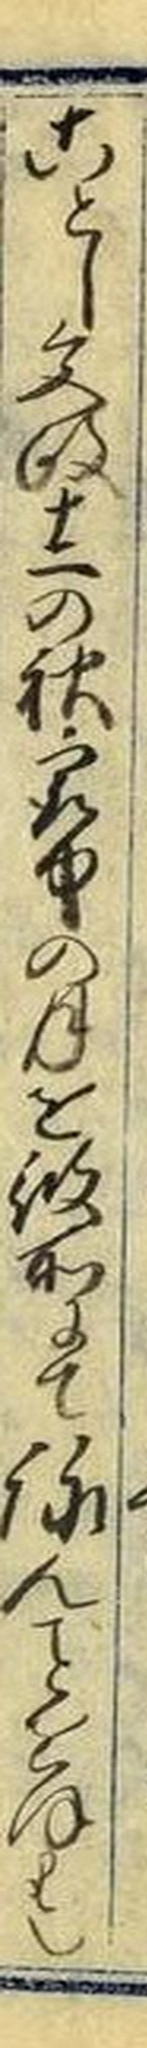ことし文政十二の秋最中の月を彼所にて詠んことをほつし
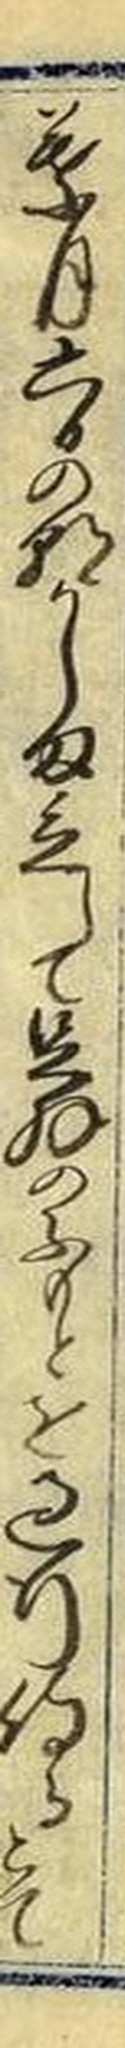葉月六日の朝かしま立して足羽のふもとを過行侍るとて
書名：温古集 三巻
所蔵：福井県文書館 Fukui Prefectural Archives
